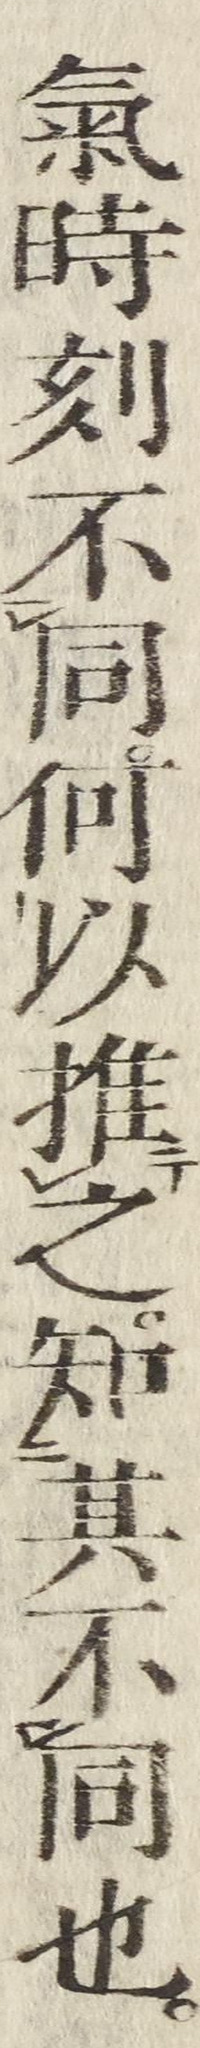気時刻不レ同。何－以推之。知其不レ同也。
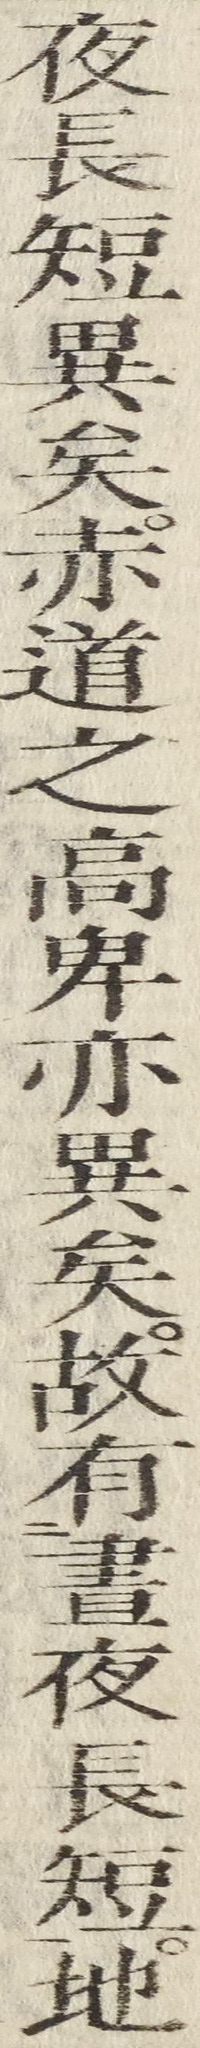夜長短異矣。赤道之高卑亦異矣。故有昼夜長短。地

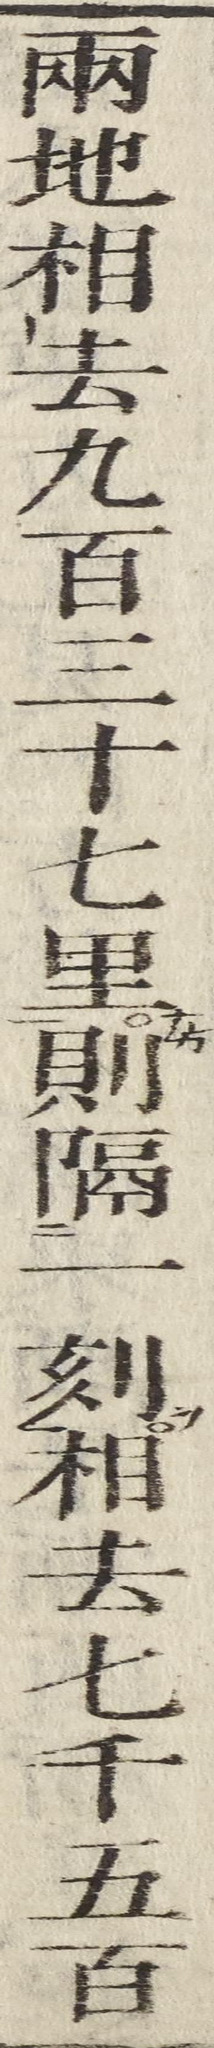両地相－去九百三十七里。則隔一刻。相去七千五百
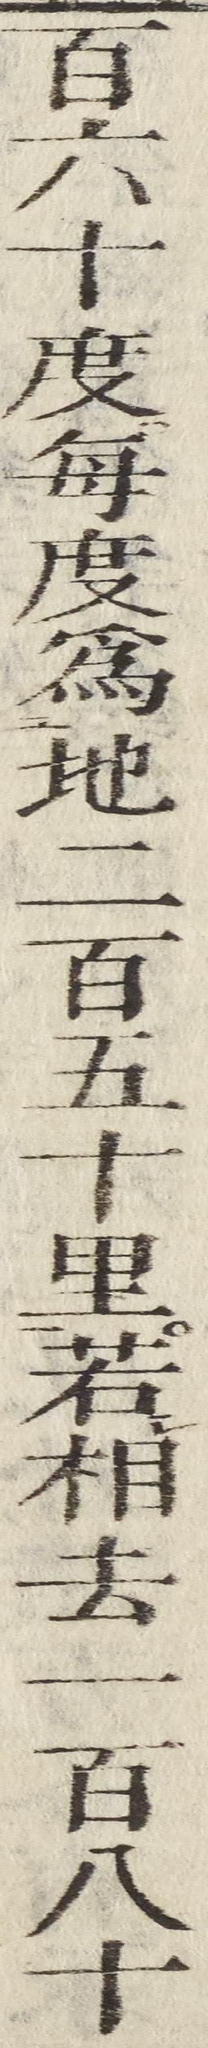百六十度。毎度為地二百五十里。若相去一百八十
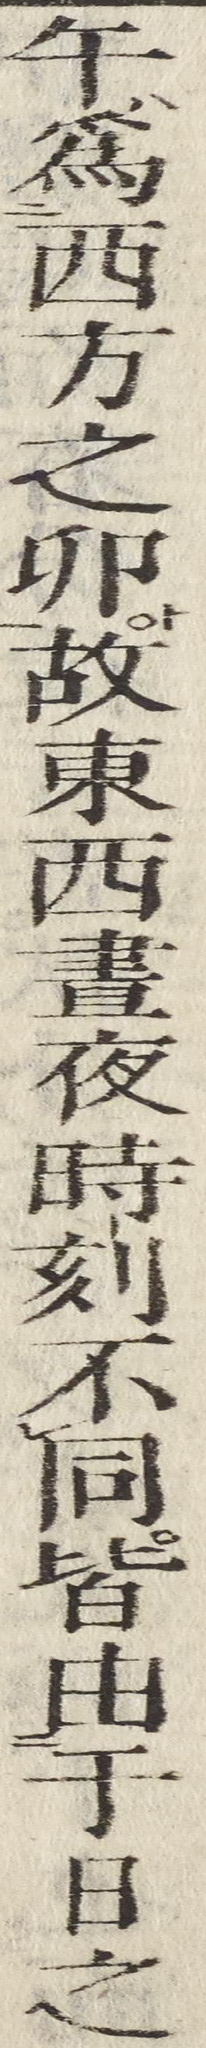午為西方之卯。故東西昼夜時－刻不同。皆由于日之
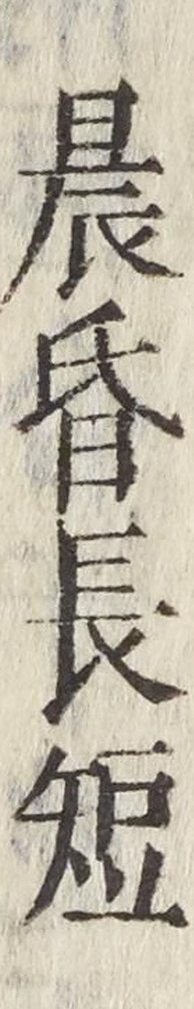晨昏長短
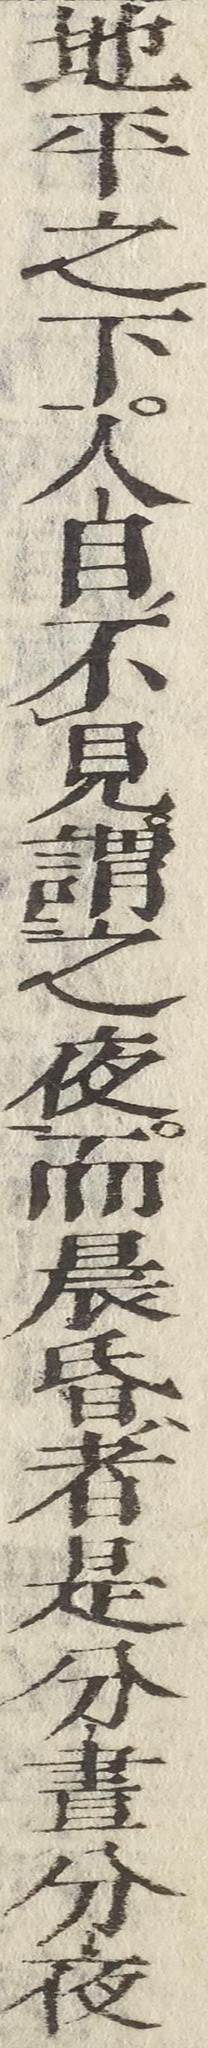地平之下。人－目不見。謂之夜。而晨昏者是分－昼分－夜

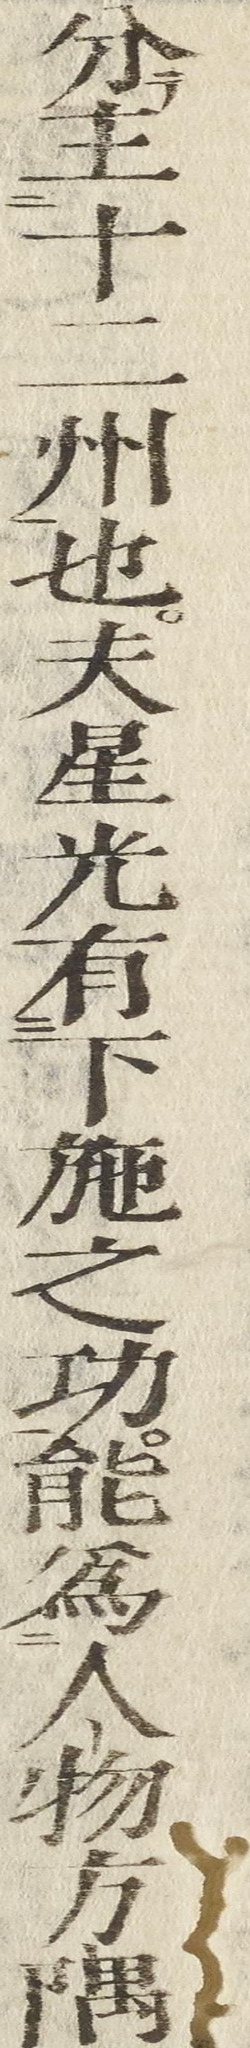分主十二州也。夫星光有下施之功。能為人－物方－隅

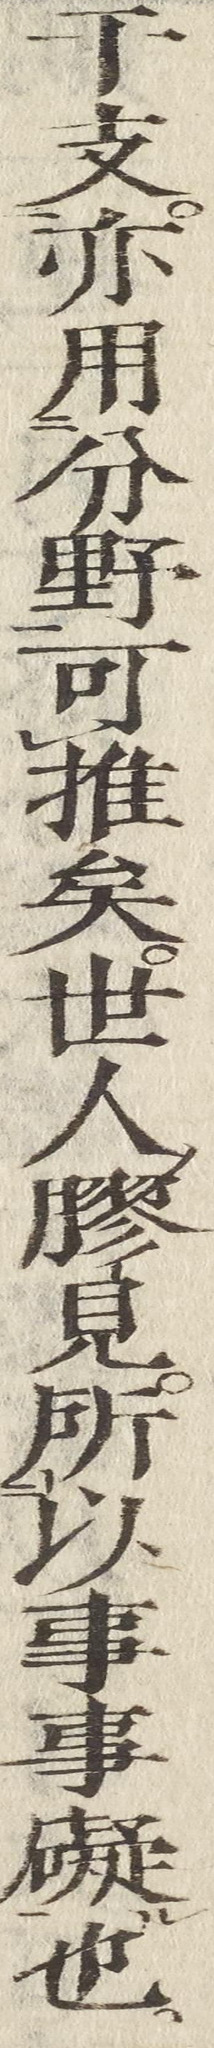干支。亦用分野可推矣。世人膠－見。所ー以事事礙也。
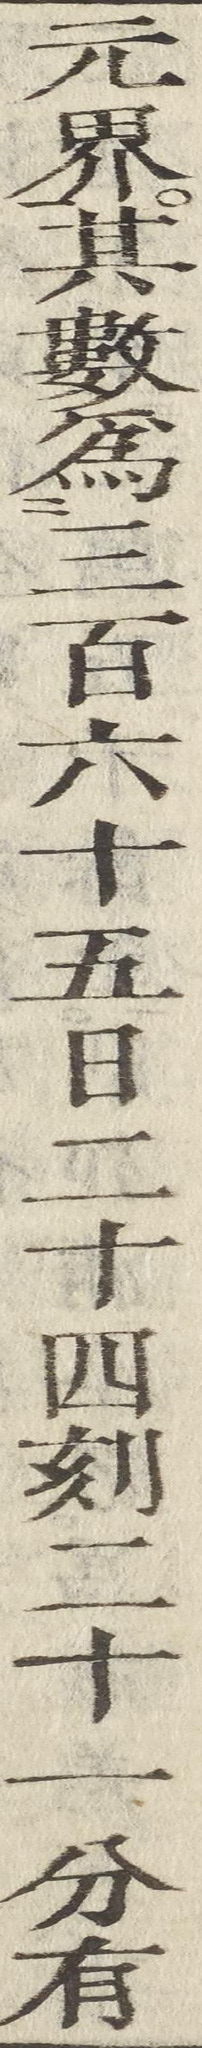元界。其数為三百六十五日二十四刻二十一分有
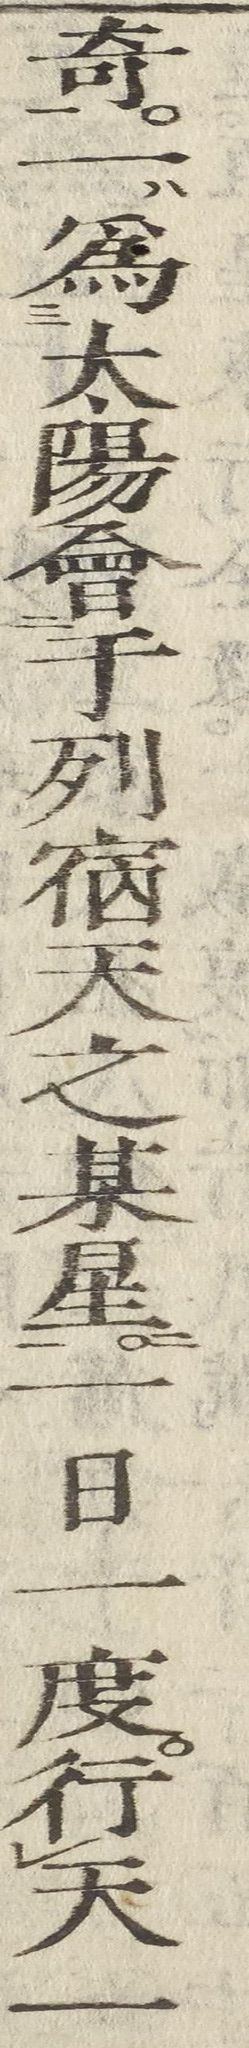奇。一為太陽会于列宿天之某星二。一日一度。行天一

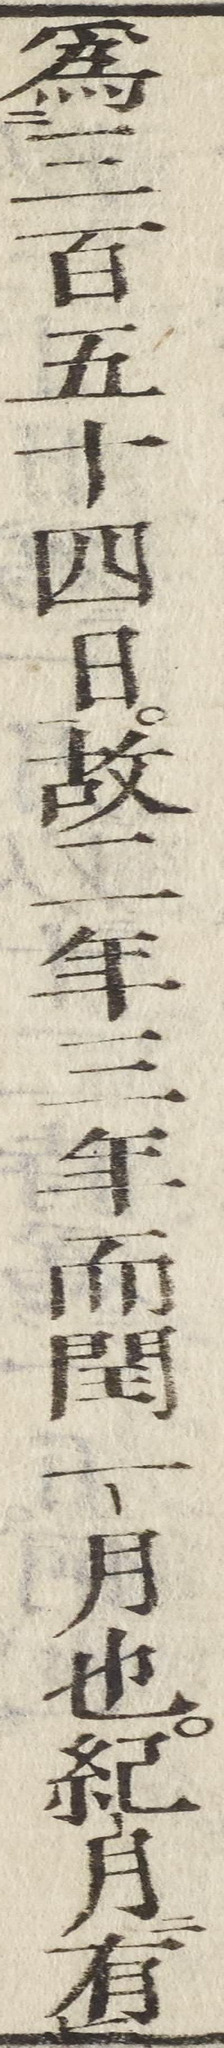為三百五十四日。故二年三年而閏一-月也。紀-月二有
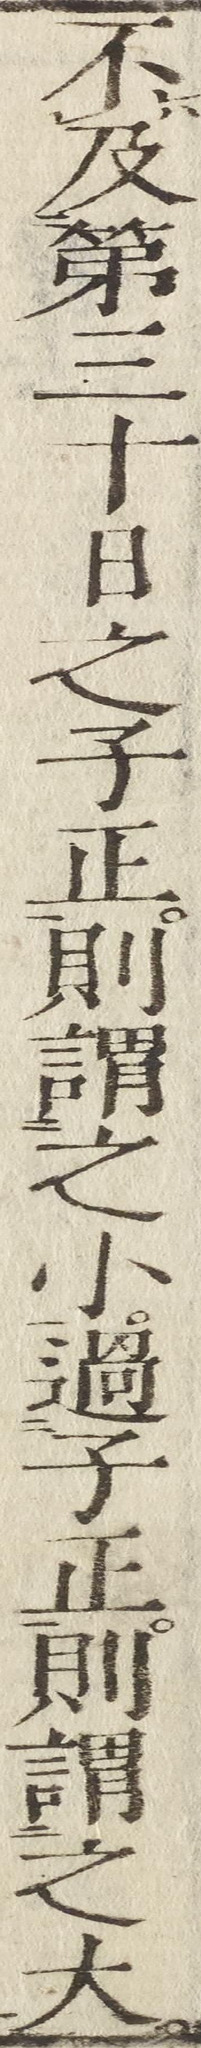不及第三十日之子正。則謂之小。過子正。則謂之大。
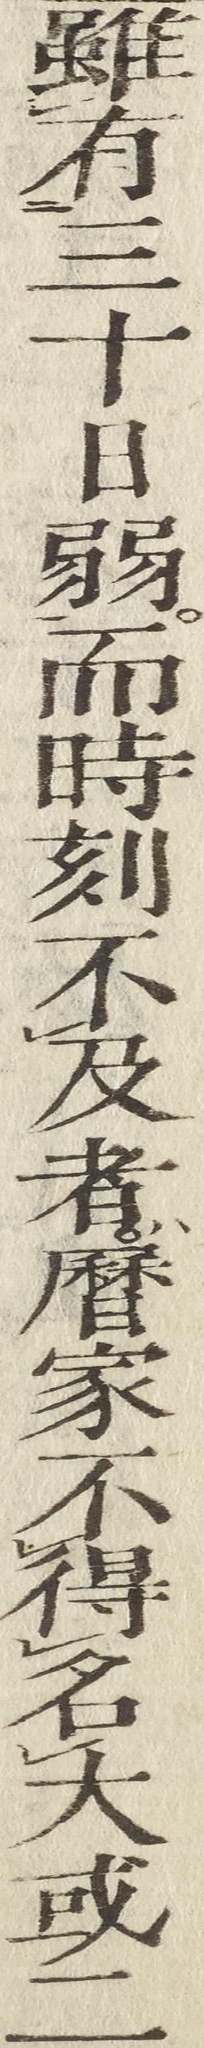雖有三十日弱。而時刻不及者。暦家不得名大或二

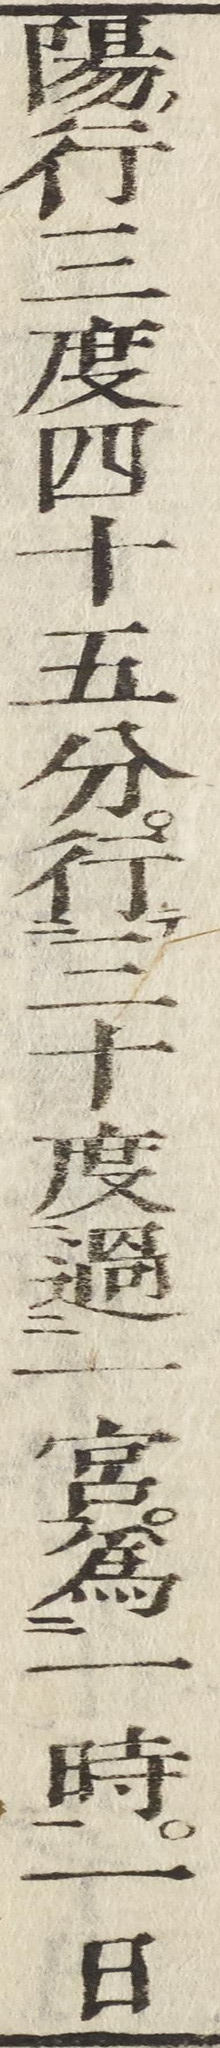陽行三度四十五分。行三十度過一宮。為一時。一日

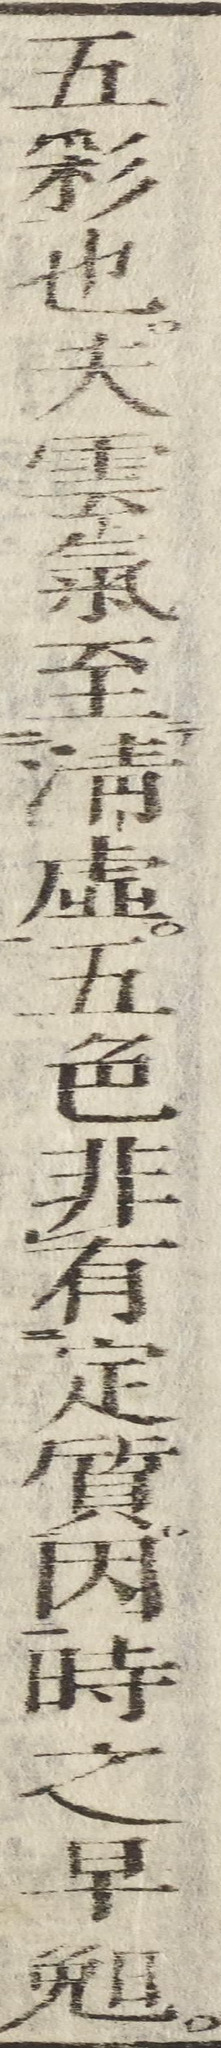五彩也。夫雲-気至清-虚。五色非有定質。因時之早晩。
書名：天經或問　地
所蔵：東京大学地震研究所図書室 Earthquake Research Institute Library, The University of Tokyo, JAPAN
